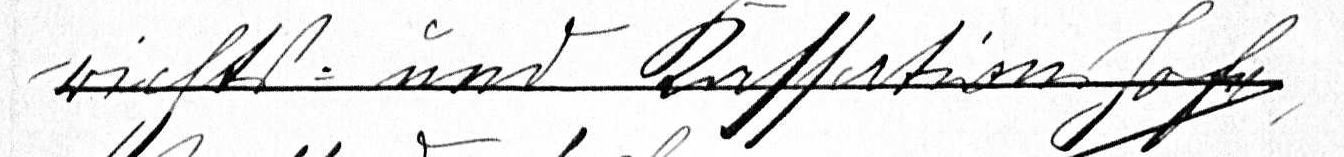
richts- und Kassationshofe,
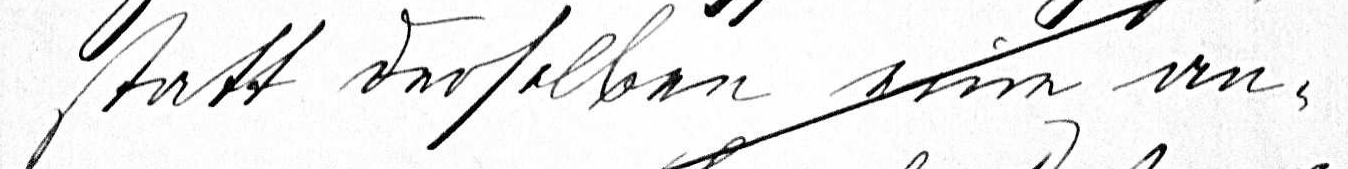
statt derselben eine an¬
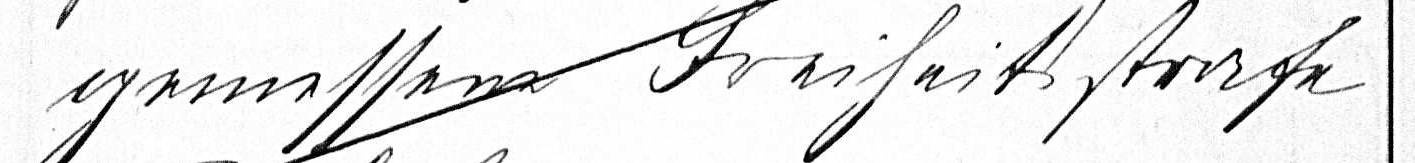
gemessene Freiheitsstrafe
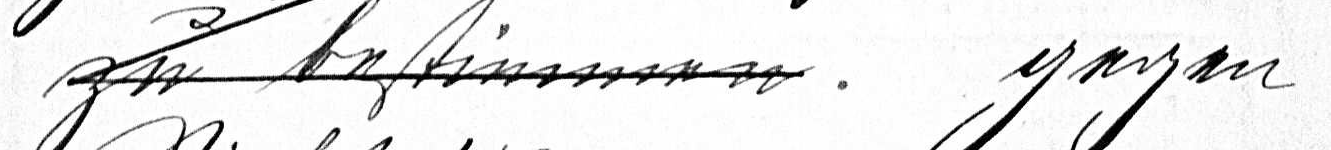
zu bestimmen. gegen
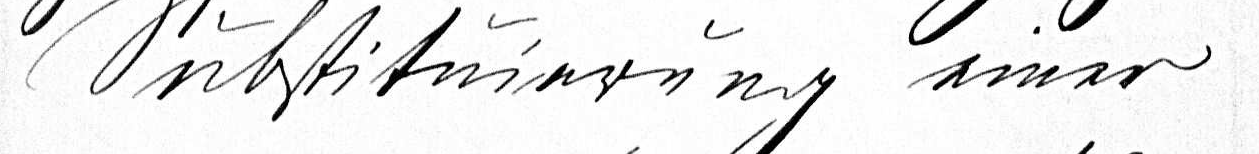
Substituierung einer
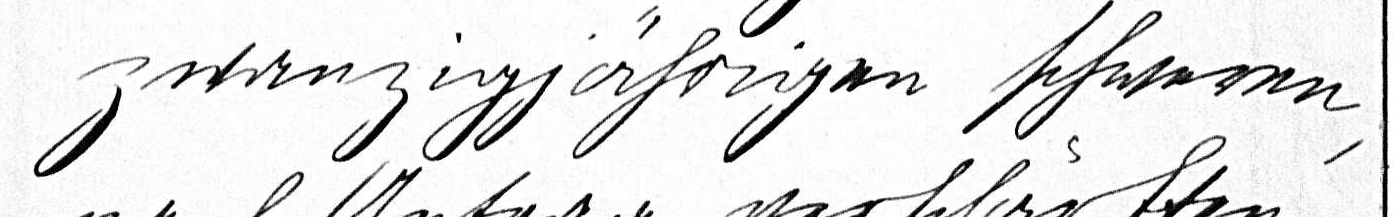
zwanzigjährigen schweren,
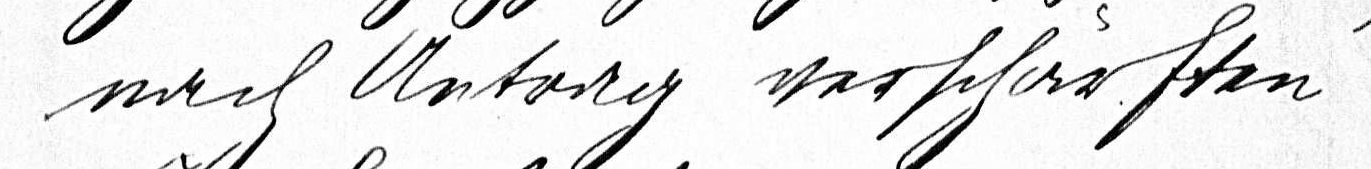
nach Antrag verschärften
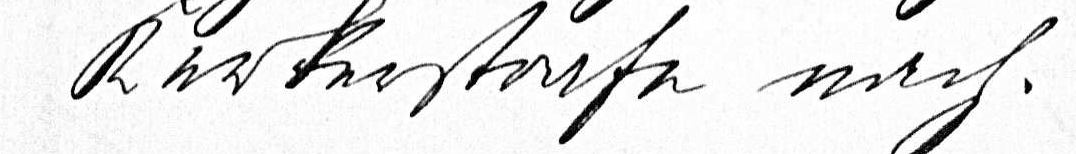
Kerkerstrafe nach.
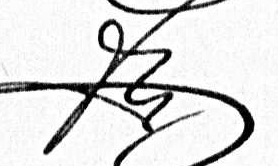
xx
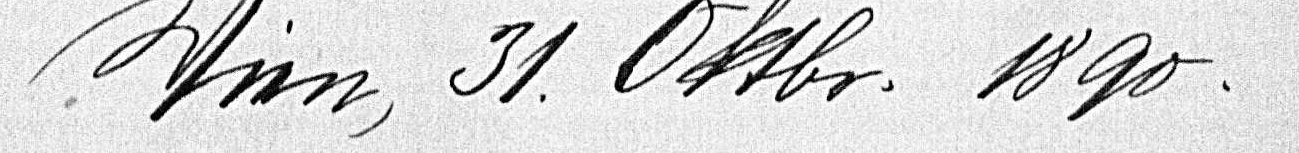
Wien, 31. Oktbr. 1890.
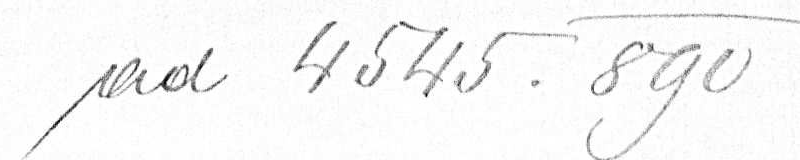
ad 4545. 890
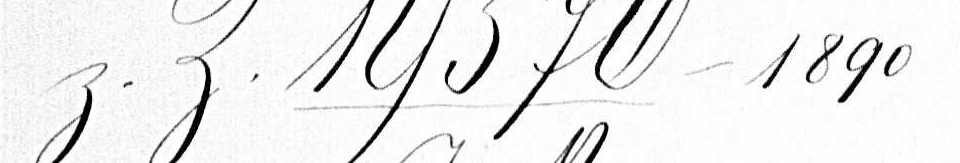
z. Z. 19576-1890
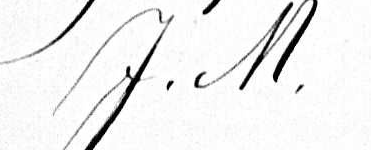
J. M.
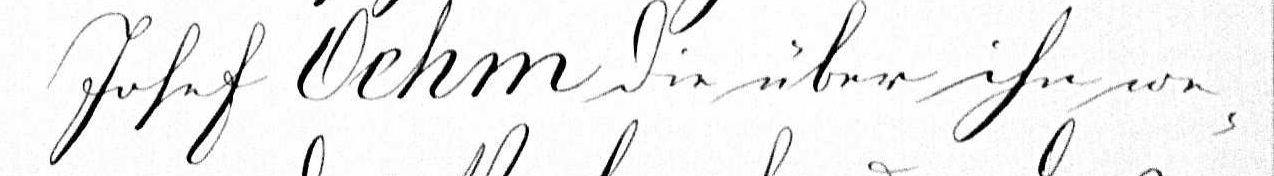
Josef Oehm die über ihn we¬
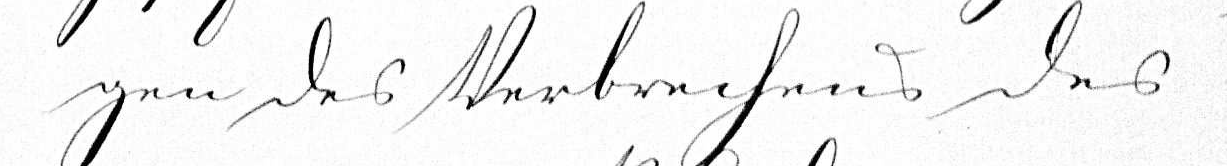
gen des Verbrechens des
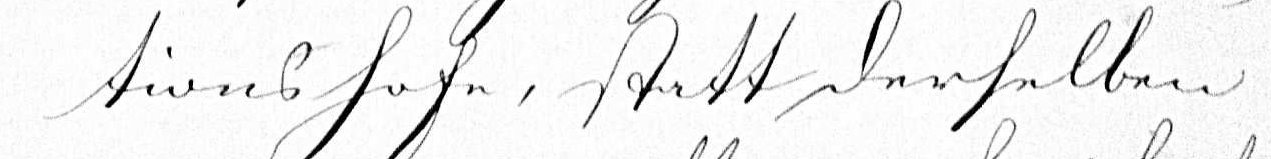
tionshofe, statt derselbe
